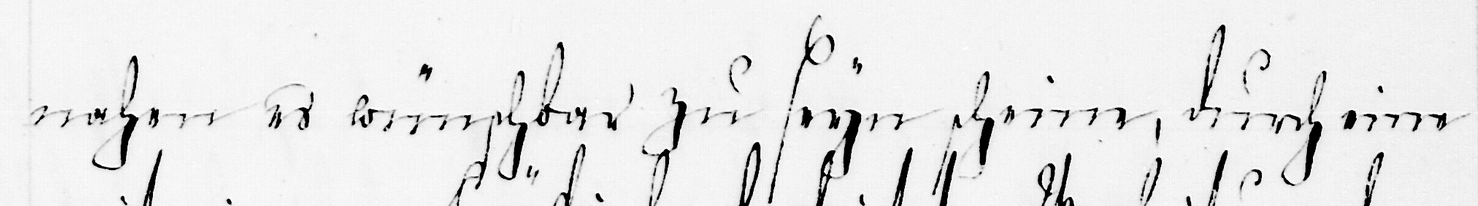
nahen es wünschbar zu seyn scheine, durch eine
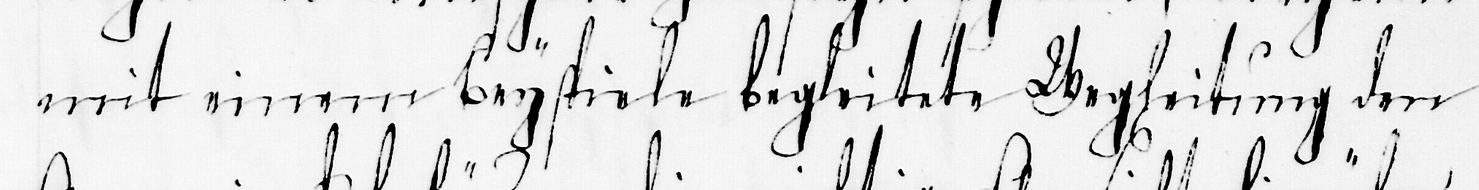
mit einem Beyspiele begleitete Wegleitung den
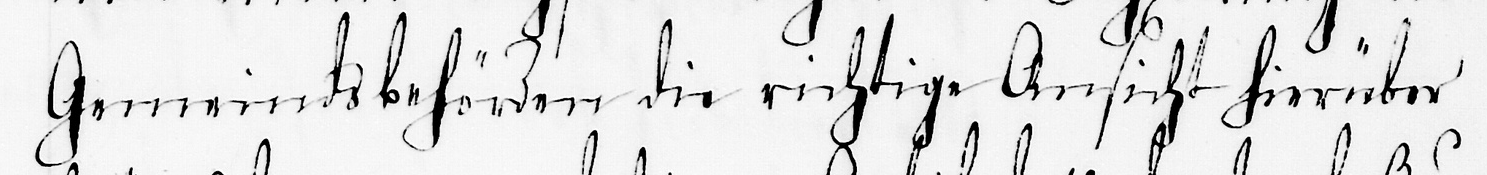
Gemeindsbehörden die richtige Ansicht hierüber
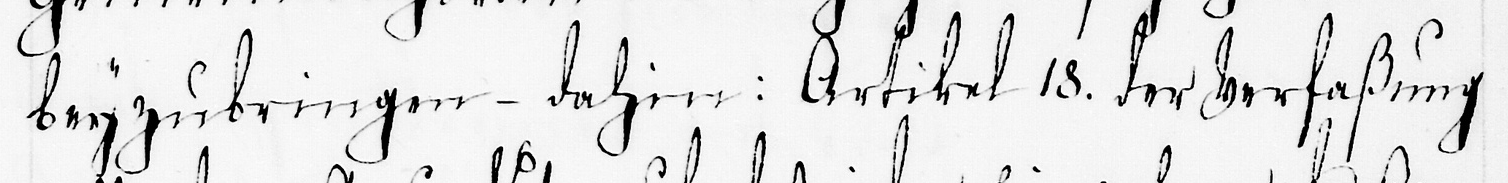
beyzubringen – dahin: Artikel 18. der Verfaßung
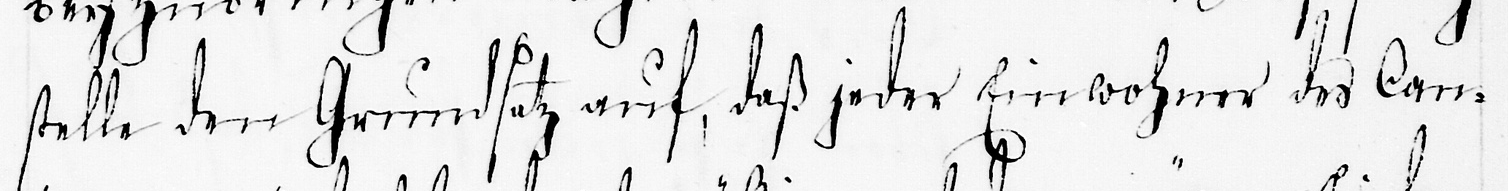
stelle den Grundsatz auf, daß jeder Einwohner des Can¬
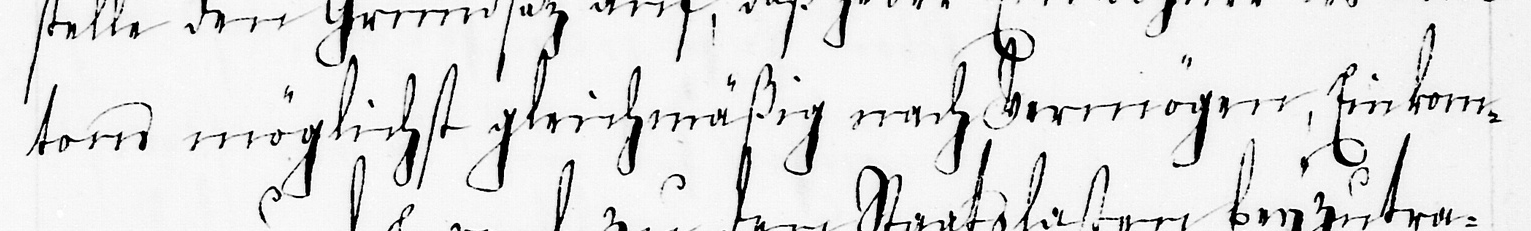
tons möglichst gleichmäßig nach Vermögen, Einkom¬
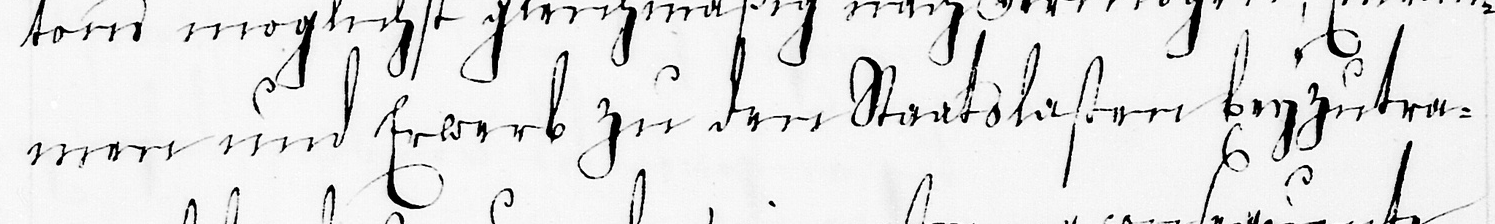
men und Erwerb zu den Staatslasten beyzutra¬
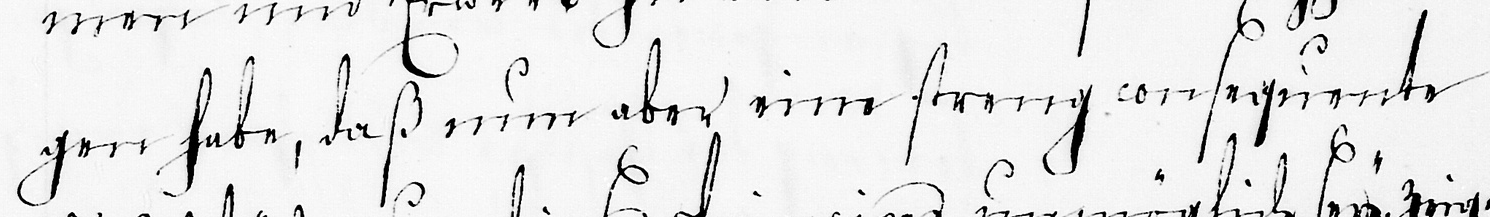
gen habe, daß nun aber eine streng consequente
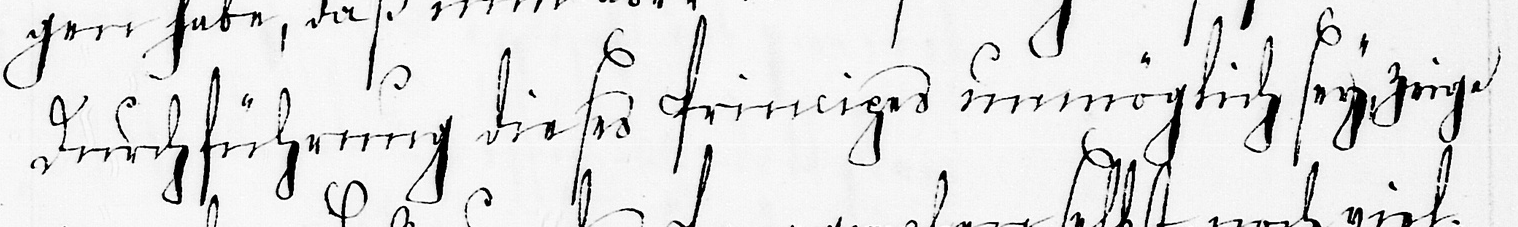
Durchführung dieses Principes unmöglich sey zeige
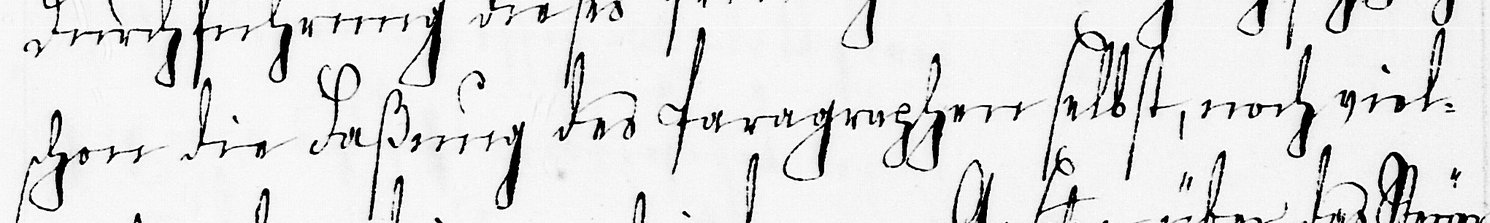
schon die Faßung des Paragraphen selbst, noch viel¬
